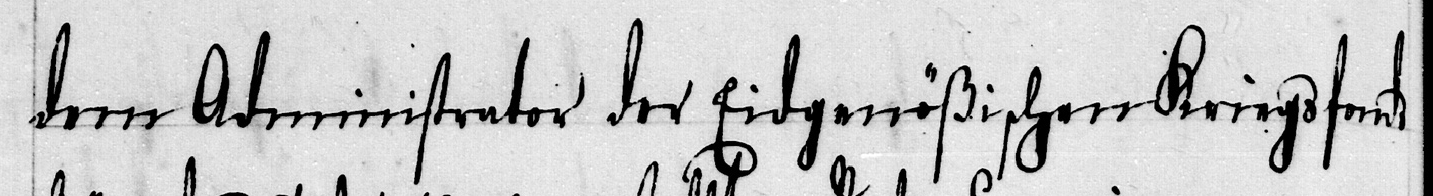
dem Administrator der Eidgenößischen Kriegsfonds
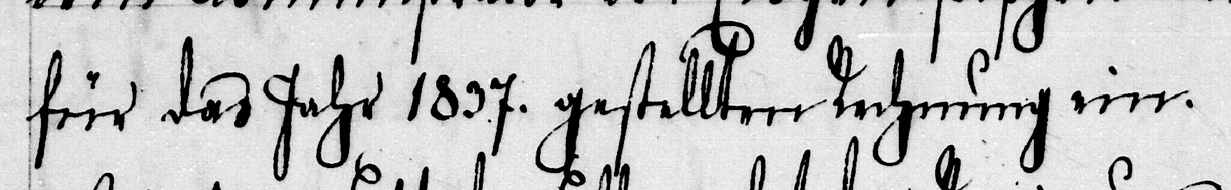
für das Jahr 1837. gestellten Rechnung ein.
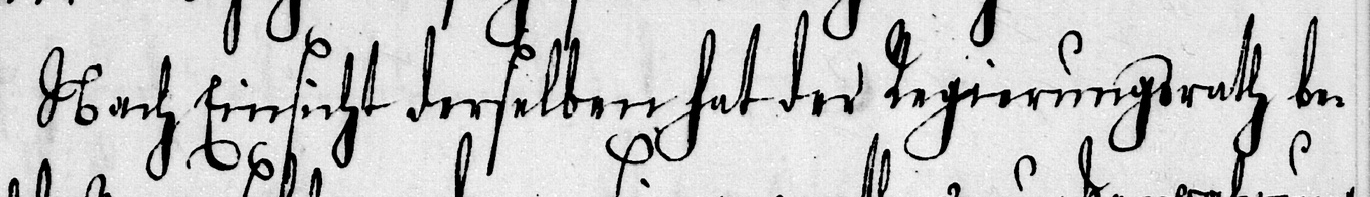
Nach Einsicht derselben hat der Regierungsrath be¬
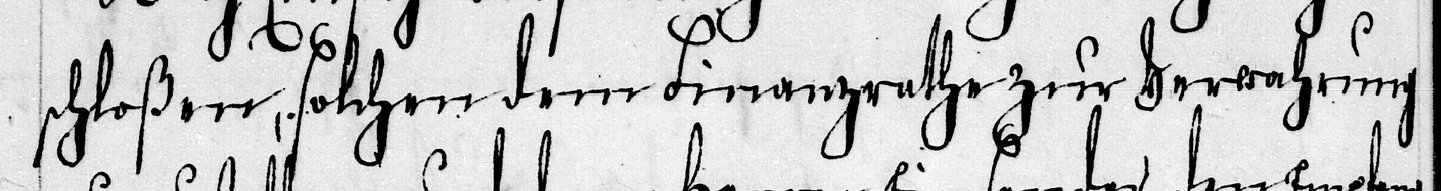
schloßen, solchen dem Finanzrathe zur Verwahrung
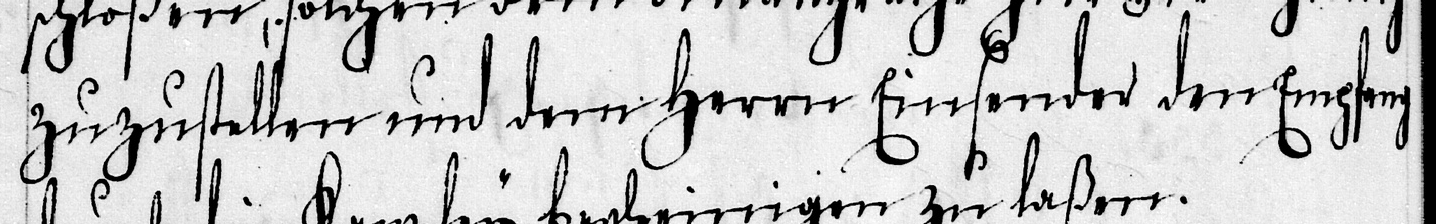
zuzustellen und dem Herrn Einsender den Empfang
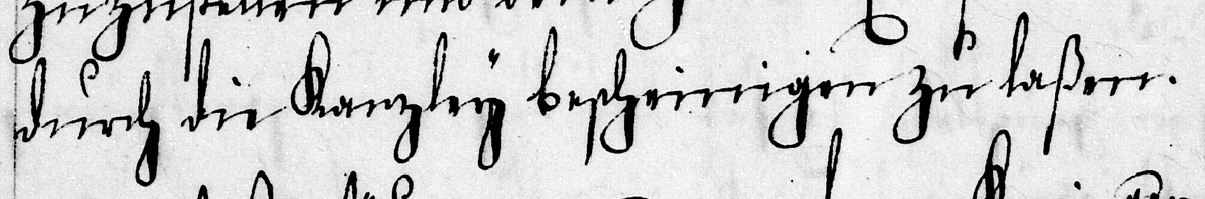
durch die Kanzley bescheinigen zu laßen.
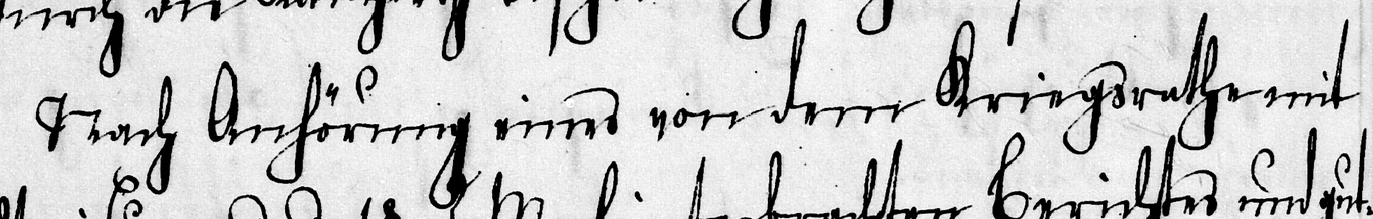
Nach Anhörung eines von dem Kriegsrathe mit
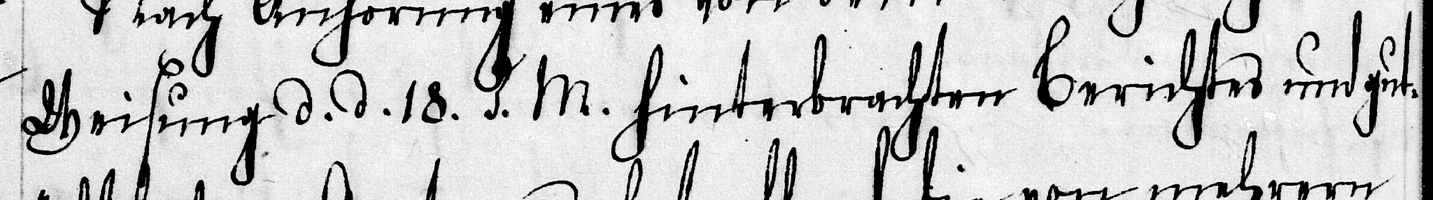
Weisung d. d. 18. d. M. hinterbrachten Berichtes und gu¬
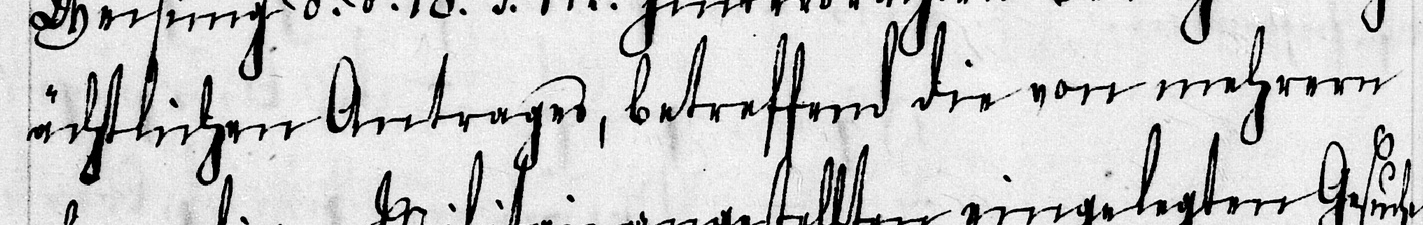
tächtlichen Antrages, betreffend die von mehrern
